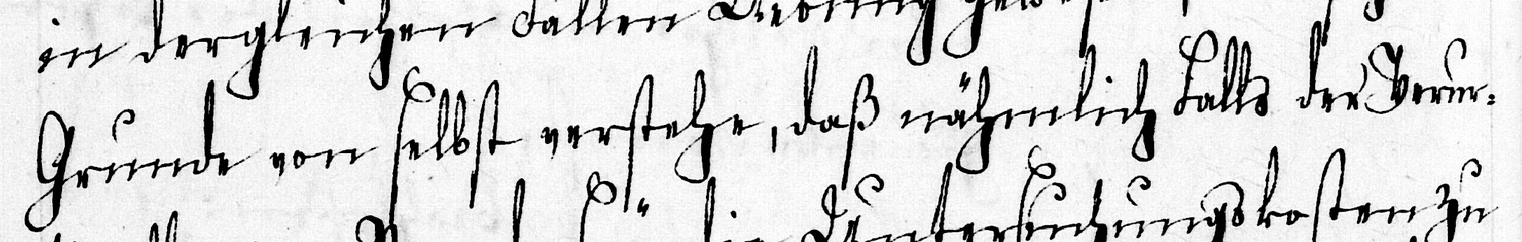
Grunde von selbst verstehe, daß nähmlich Falls der Verur¬
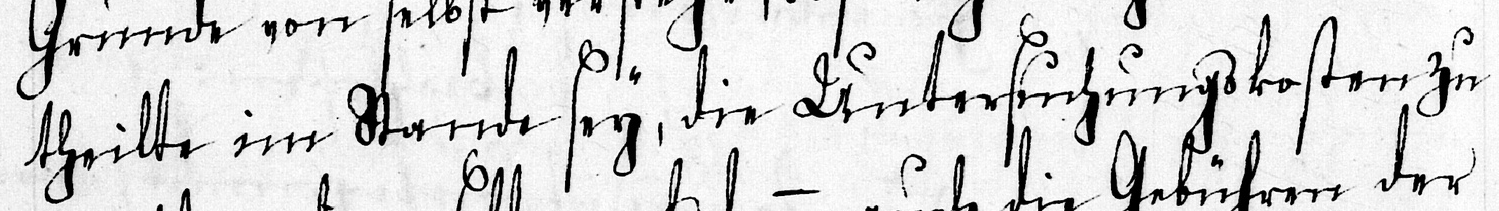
theilte im Stande sey, die Untersuchungskosten zu
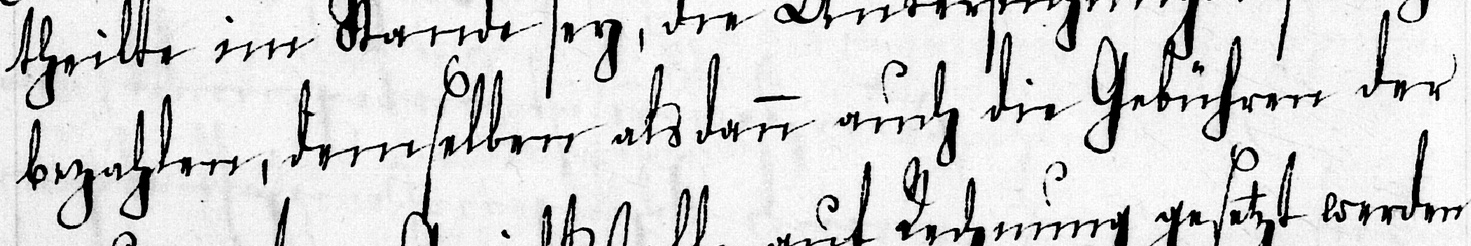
bezahlen, demselben als dann auch die Gebühren der
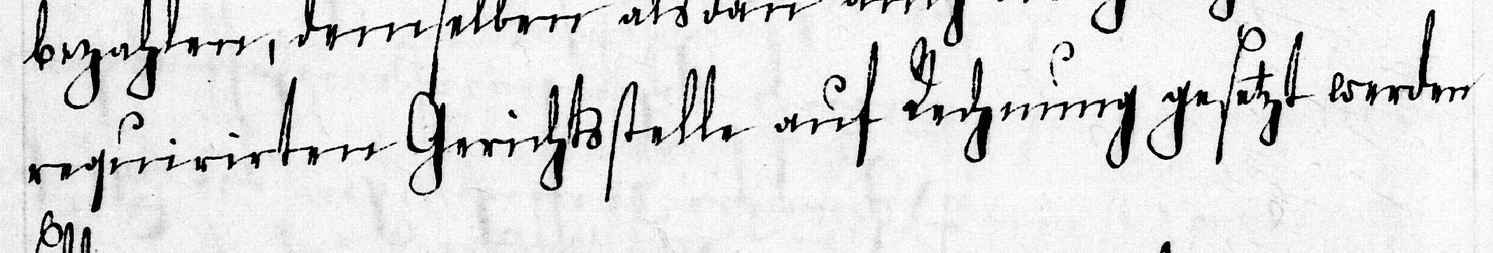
requirirten Gerichtsstelle auf Rechnung gesetzt werden
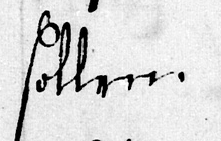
sollen.
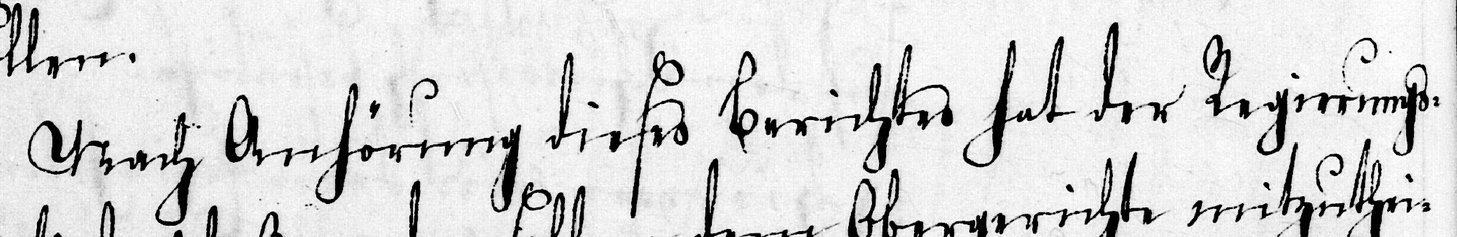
Nach Anhörung dieses Berichtes hat der Regierungs¬
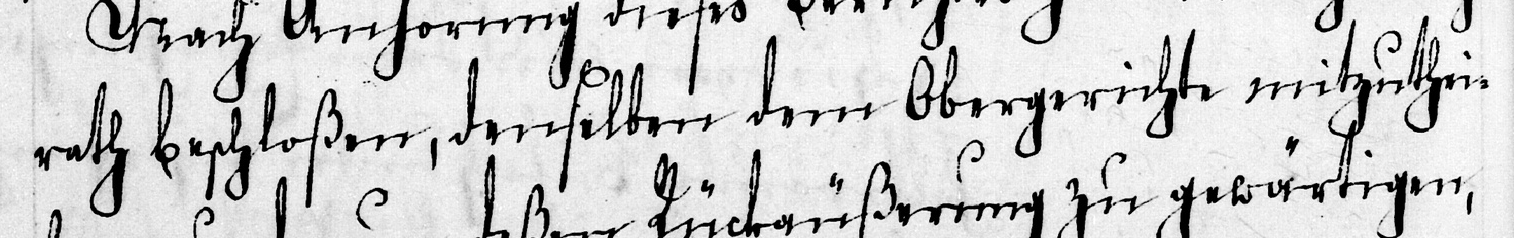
rath beschloßen, denselben dem Obergerichte mitzuthei¬
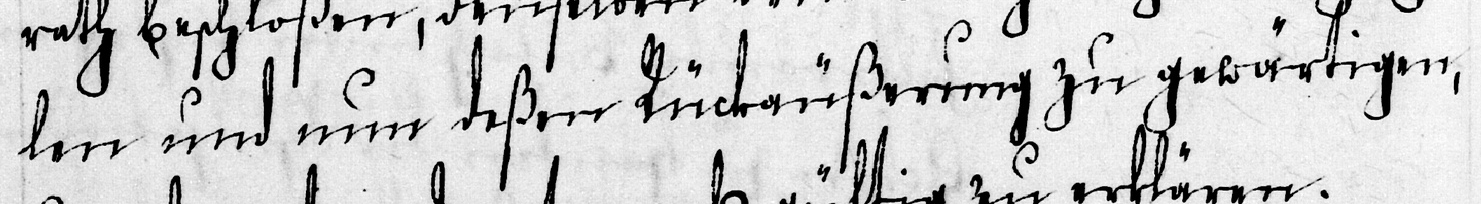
len und nun deßen Rückäußerung zu gewärtigen,
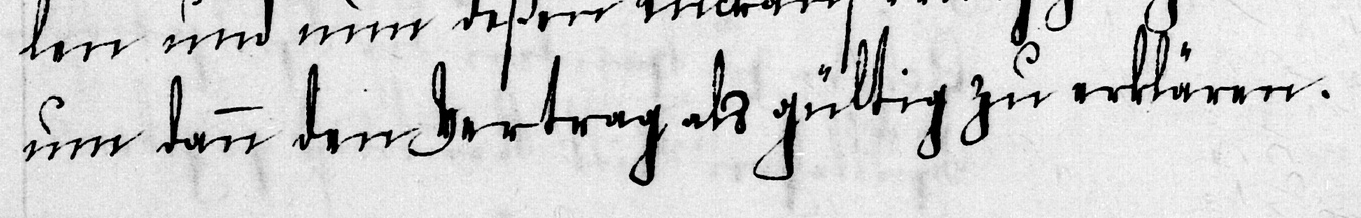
um dann den Vertrag als gültig zu erklären.
